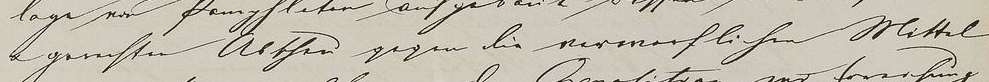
& gerechten Abscheu gegen die verwerflichen Mittel
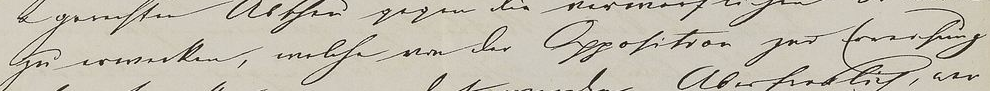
zu erwecken, welche von der Opposition zur Erreichung
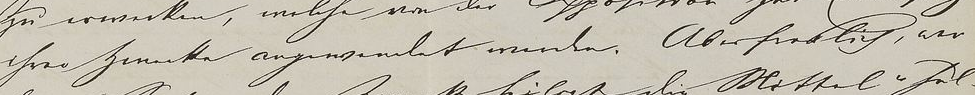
ihrer Zwecke angewendet werden. Aber freilich, wer
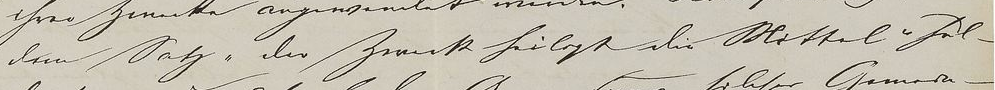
dem Satz «der Zweck heiligt die Mittel» hul-
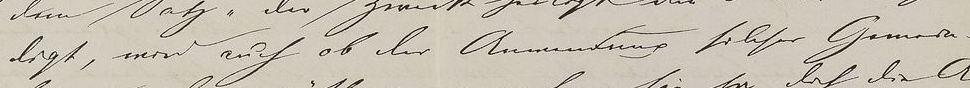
digt, wird auch ob der Anwendung solcher Gemein-
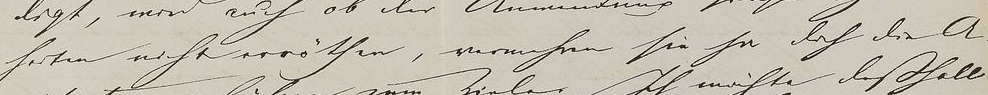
heiten nicht erröthen, vermehren sie ja doch die A-
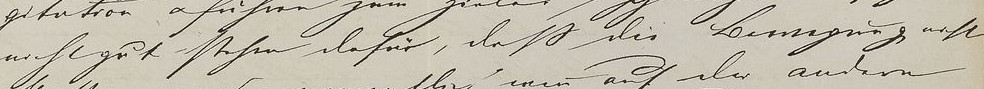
nicht gut stehen dafür, daß die Bewegung nicht
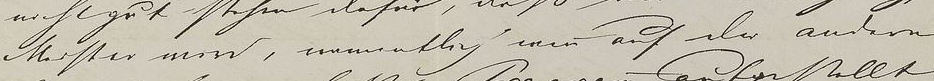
Meister wird, namentlich wenn auf der andern
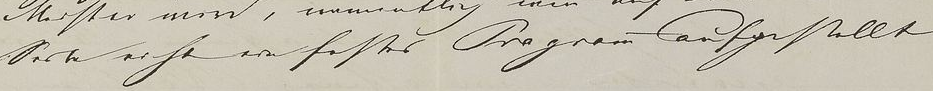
Seite nicht ein festes Programm aufgestellt
